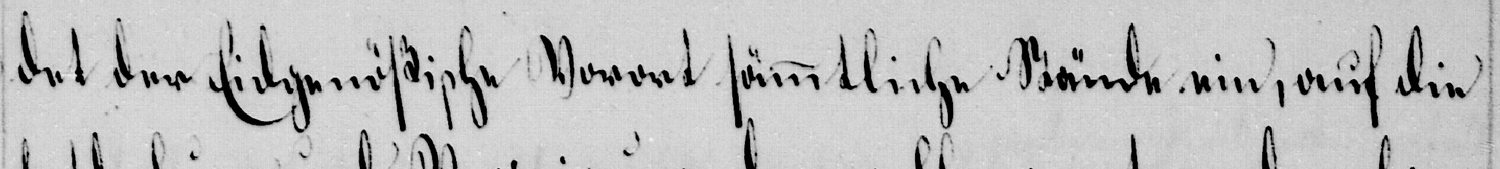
det der Eidgenößische Vorort sämmtliche Stände ein, auf die
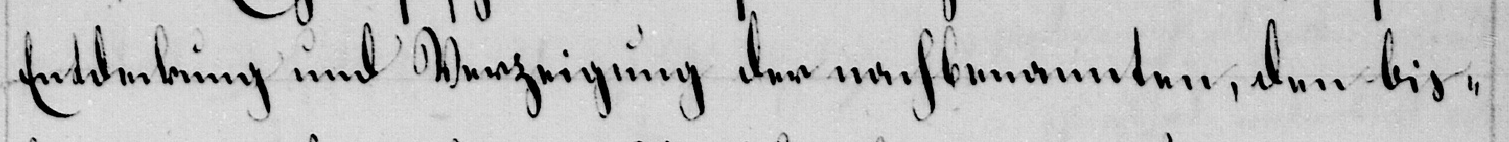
Entdeckung und Verzeigung der nachbenannten, den bis¬
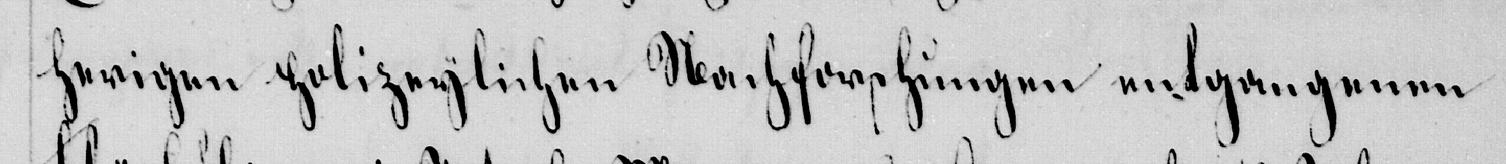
herigen polizeylichen Nachforschungen entgangenen
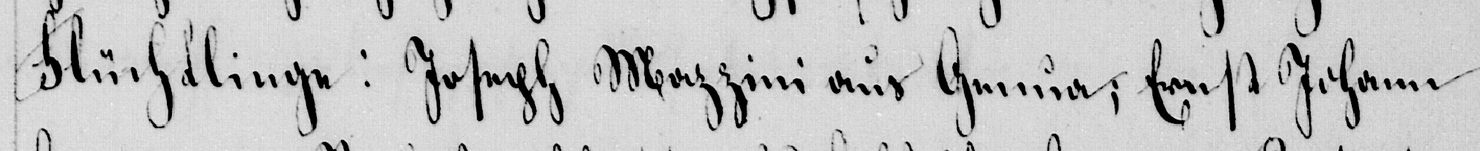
Flüchtlingen: Joseph Mazzini aus Genua; Ernst Johann
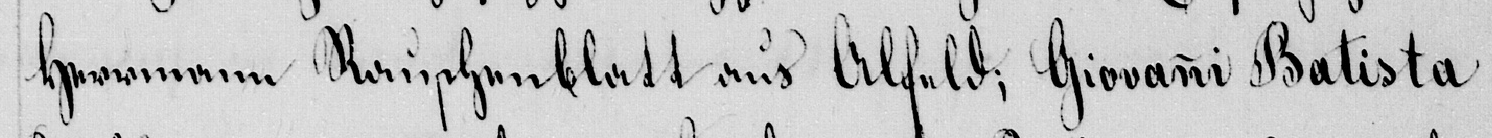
Herrmann Rauschenblatt aus Alfeld; Giovanni Batista
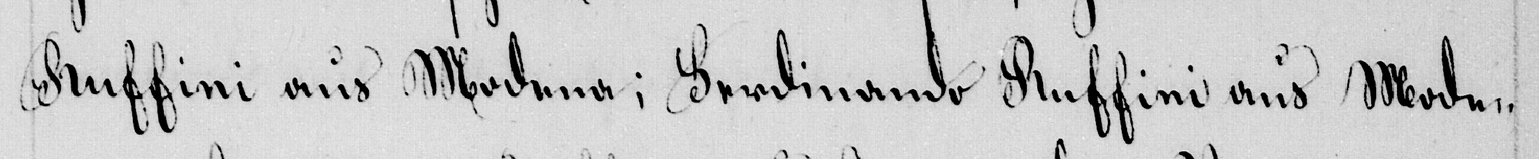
Ruffini aus Modena; Ferdinando Ruffini aus Moden¬
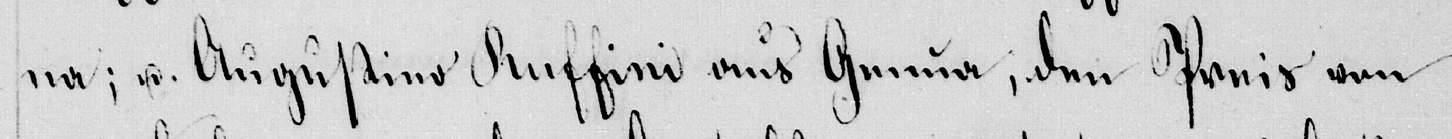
a; u. Augustinus Ruffini aus Genua, den Preis von
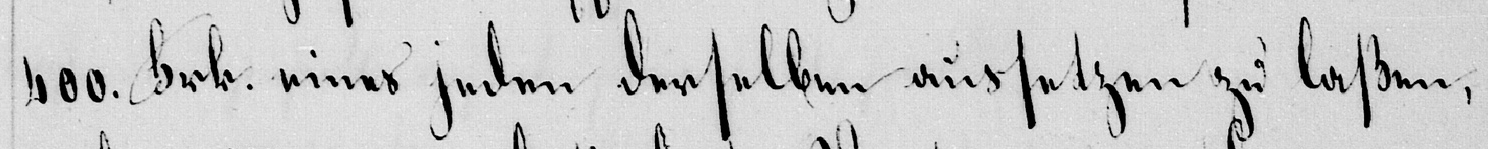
400. Frk. eines jeden derselben aussetzen zu laßen,
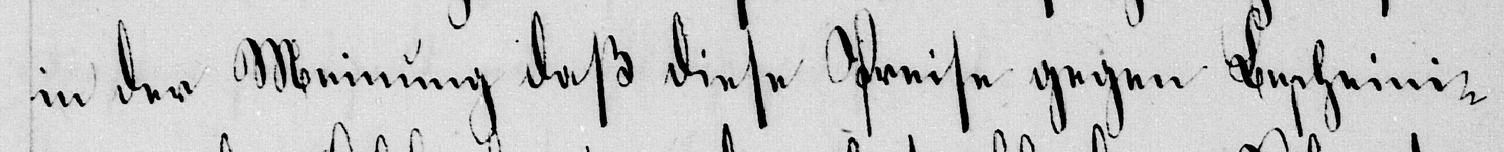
in der Meinung daß diese Preise gegen Bescheini¬
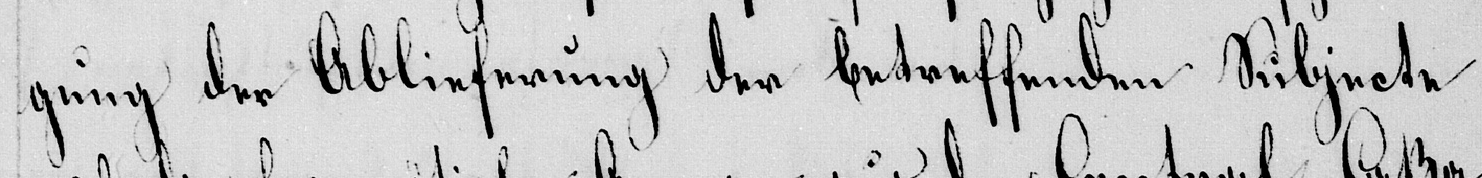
gung der Ablieferung der betreffenden Subjecte
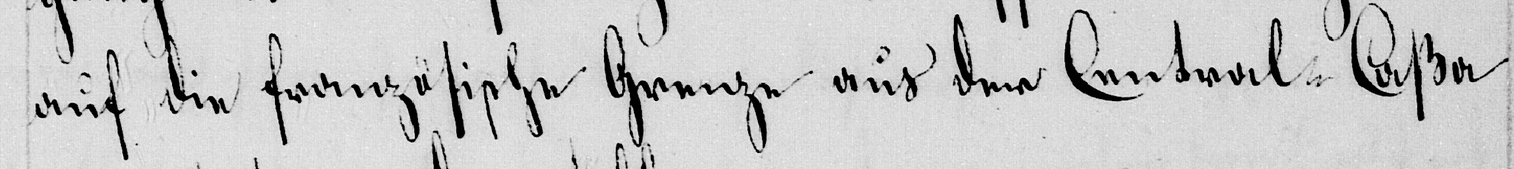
auf die französische Grenze aus der Central-Caßa
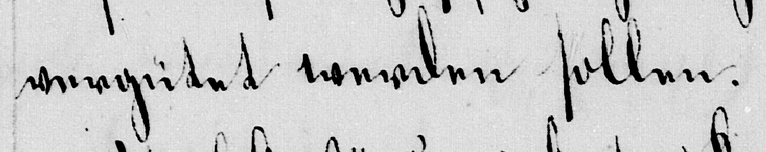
vergütet werden sollen.
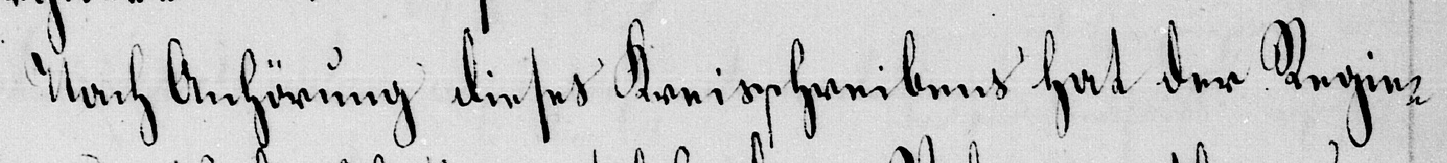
Nach Anhörung dieses Kreisschreibens hat der Regie¬
